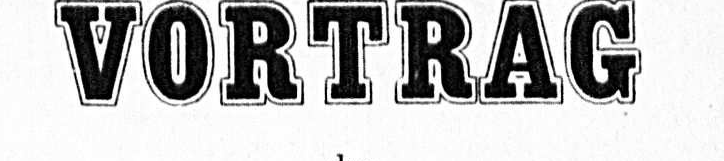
VORTRAG
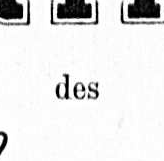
Des
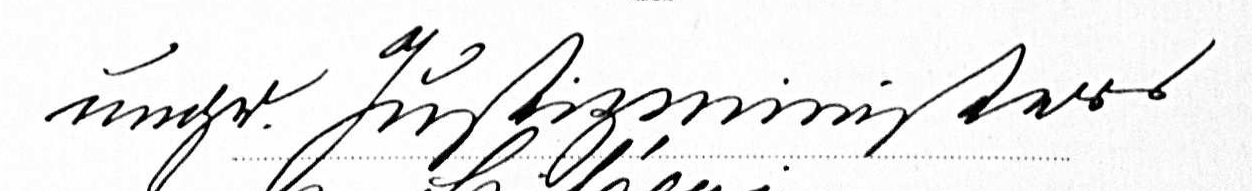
ungr. Justizministers
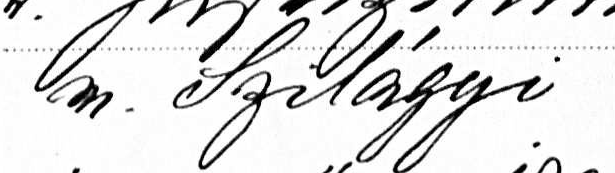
v. Szilágyi
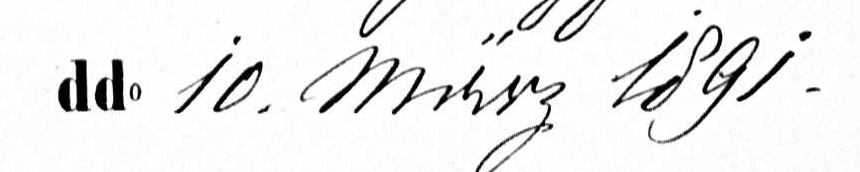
Ddo 10 März 1891
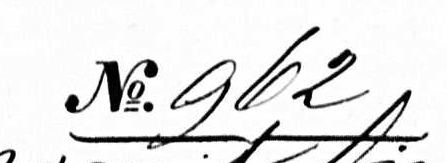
No 962
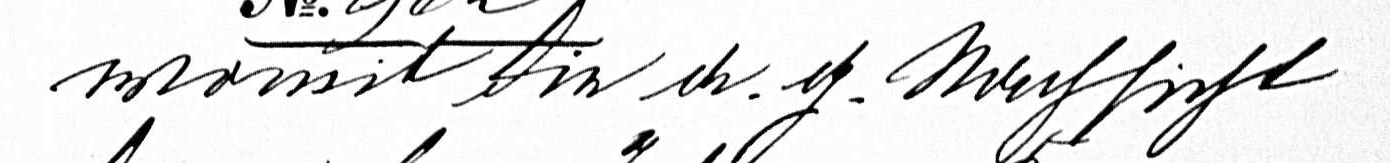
Womit die a.g. Nachsicht
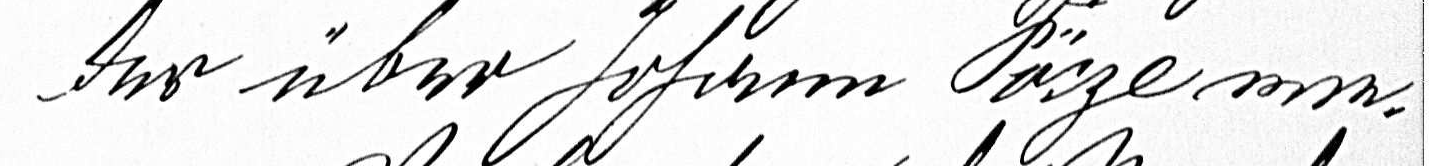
der über Johann Pöcze we¬
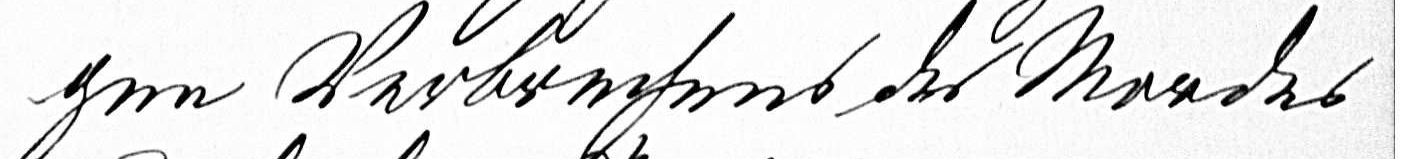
gen Verbrechens des Mordes
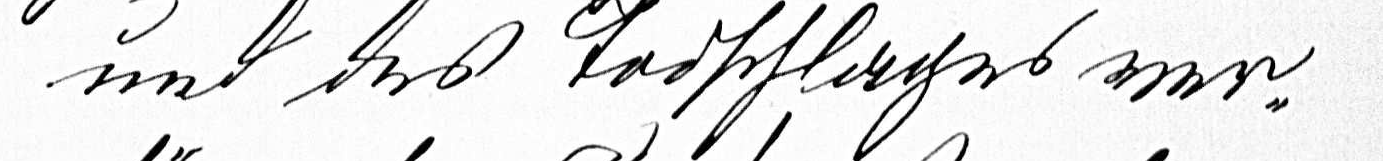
und des Todschlages ver¬
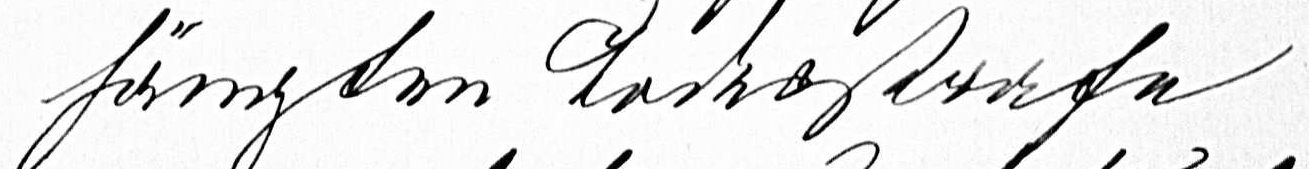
hängten Todesstrafe
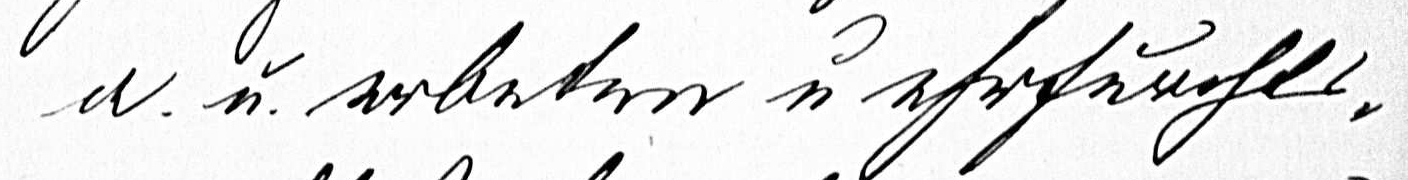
a.u. erbeten u ehrfurchts¬
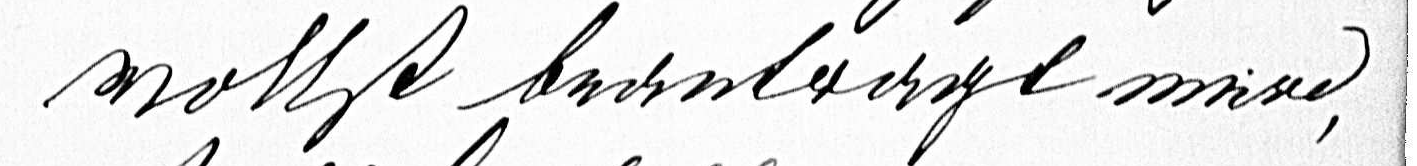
vollst beantragt wird,
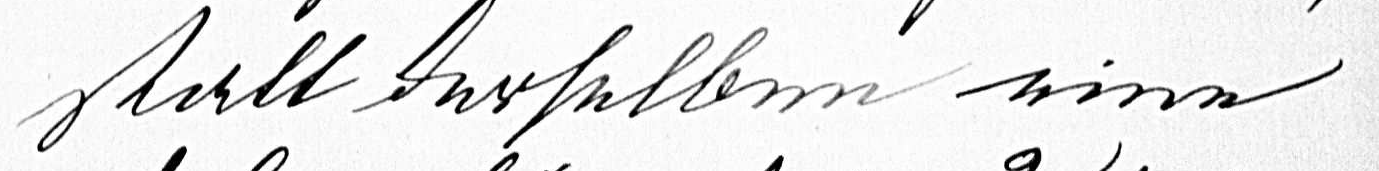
statt derselben eine
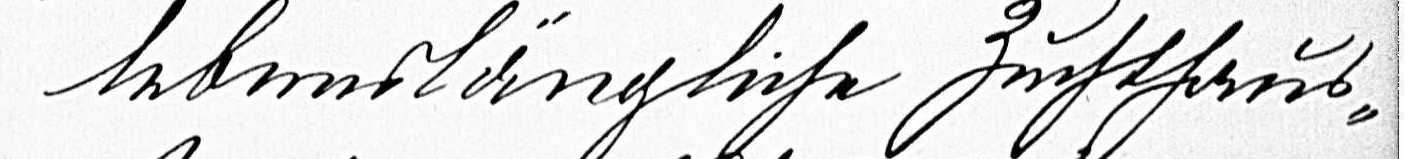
lebenslängliche Zuchthaus¬
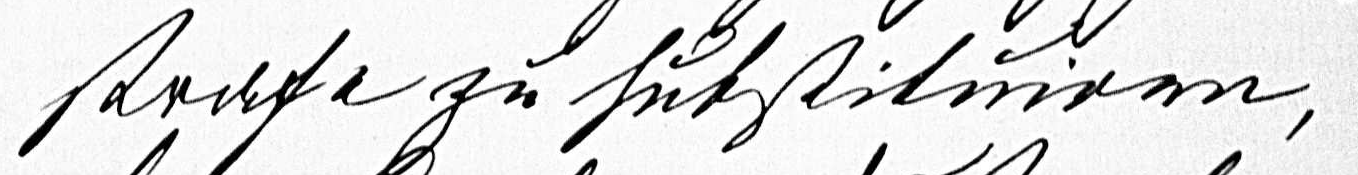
strafe zu substituiren,
